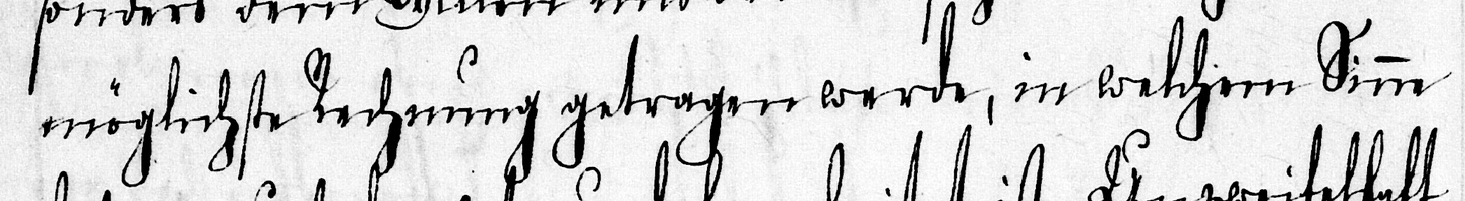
möglichste Rechnung getragen werde, in welchem Sinne
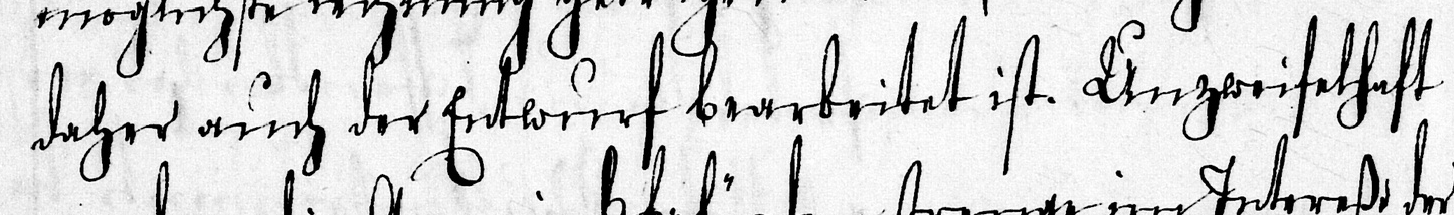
daher auch der Entwurf bearbeitet ist. Unzweifelhaft
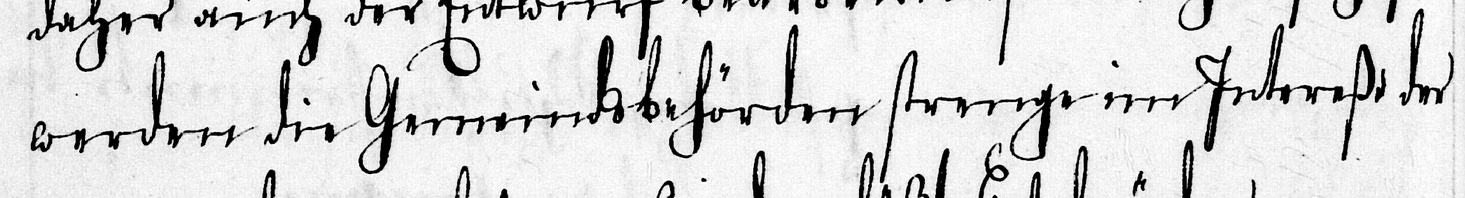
werden die Gemeindsbehörden strenge im Intereße
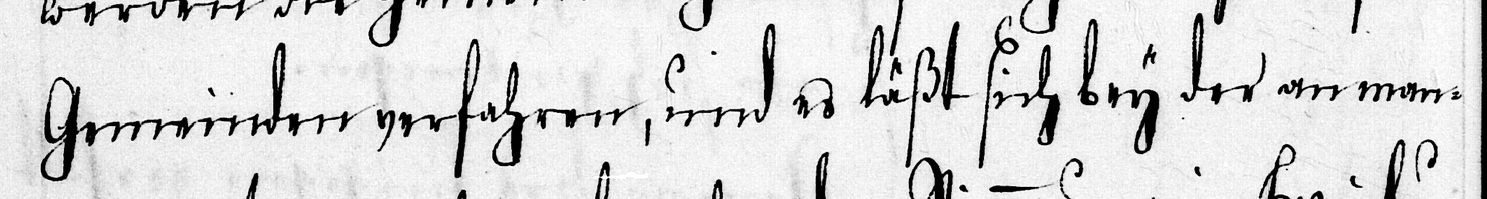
Gemeinden verfahren, und es läßt sich bey der an man¬
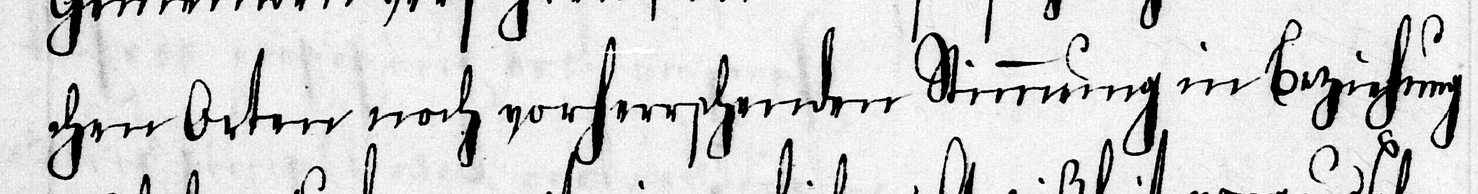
chen Orten noch vorherrschenden Stimmung in Beziehung
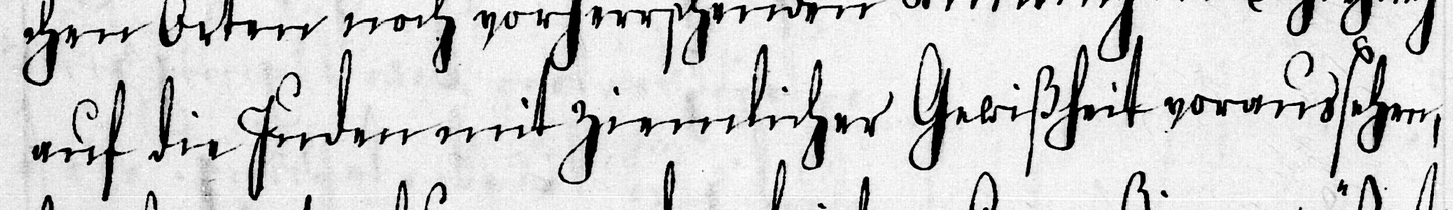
auf die Juden mit ziemlicher Gewißheit voraussehen,
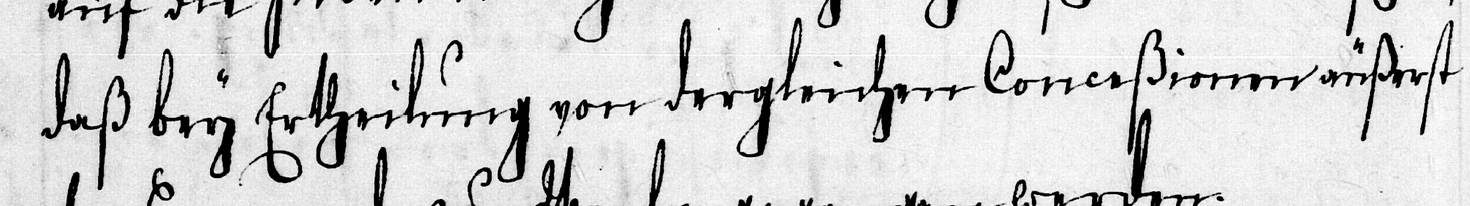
daß bey Ertheilung von dergleichen Conceßionen äußerst
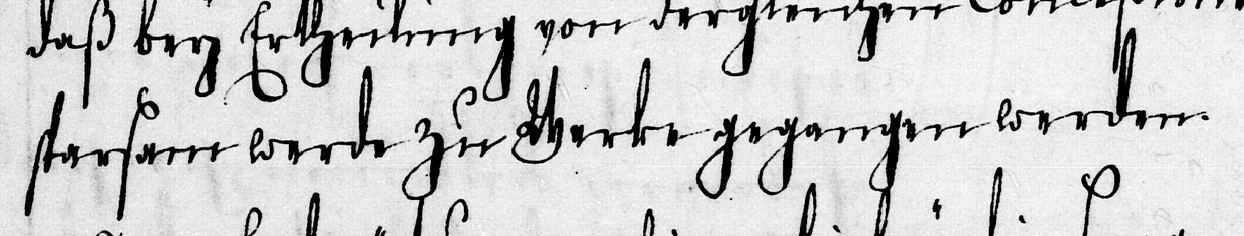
sparsam werde zu Werke gegangen werden.
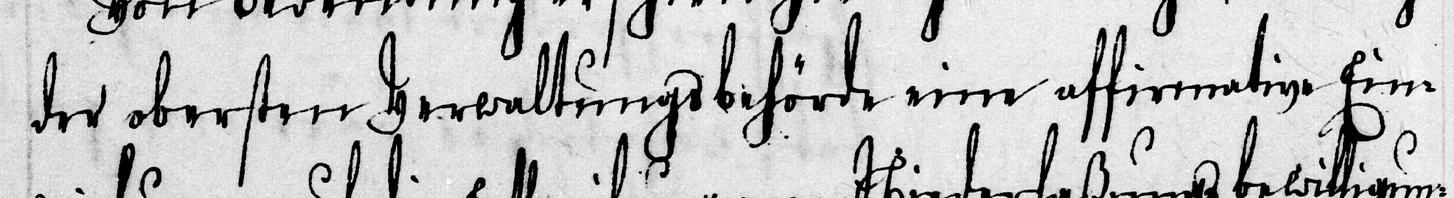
der obersten Verwaltungsbehörde eine affirmative Ein¬
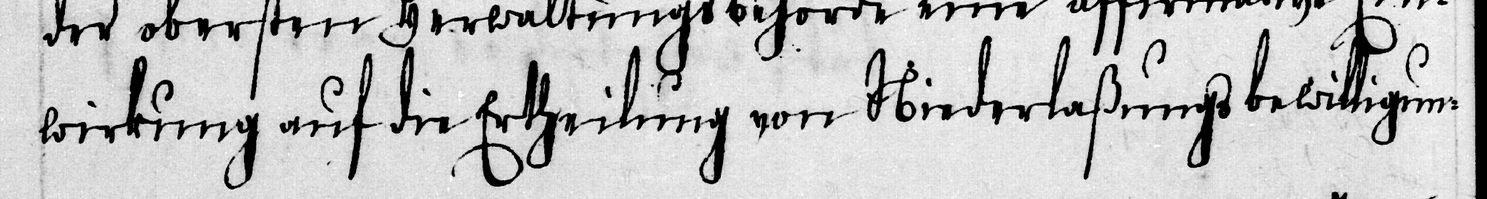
wirkung auf die Ertheilung von Niederlaßungsbewilligun-
